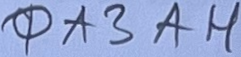фазан
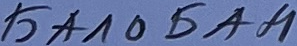балобан
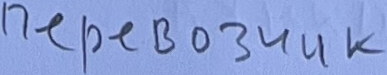перевозчик
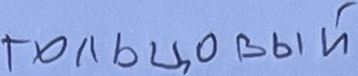гольцовый
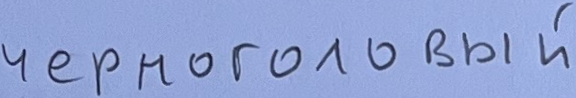черноголовый
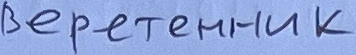веретенник
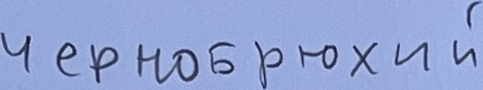чернобрюхий
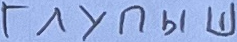глупыш
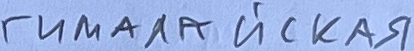гималайская
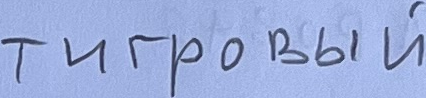тигровый
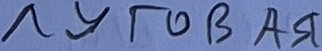луговая
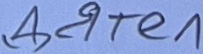дятел
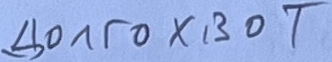долгохвот
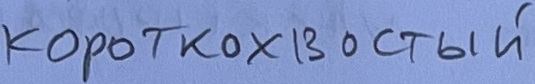короткохвостый
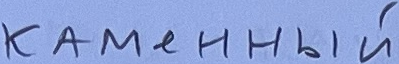каменный
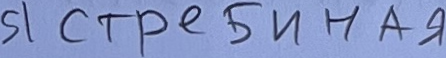ястребиная
